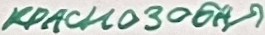краснозобая
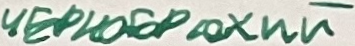чернобрюхий
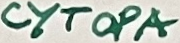сутора
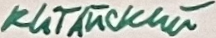китайский
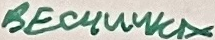весничка
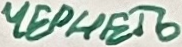чернеть
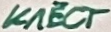клёст
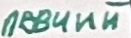певчий
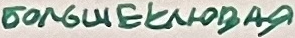большеклювая
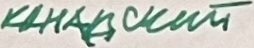канадский
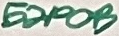бэров
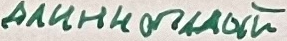длиннопалый
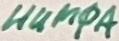нимфа
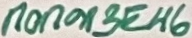поползень
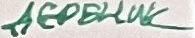дербник
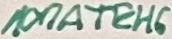лопатень
